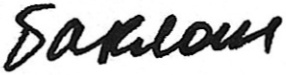баклан
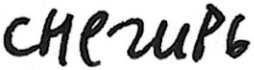снегирь
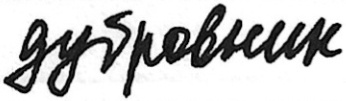дубровник
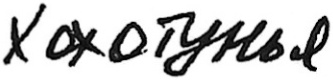хохотунья
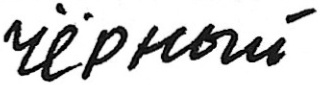чёрный
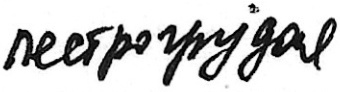пестрогрудая
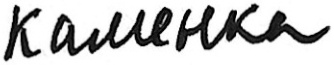каменка
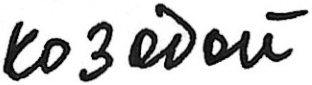козодой
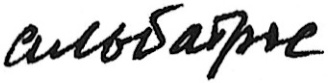альбатрос
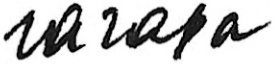гагара
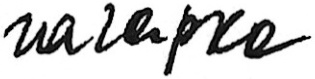гагарка
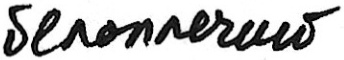белоплечий
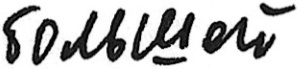большой
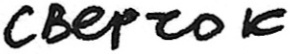сверчок
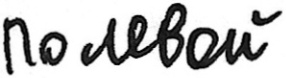полевой
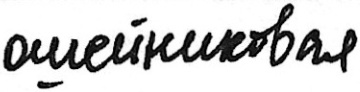ошейниковая
